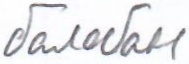балобан
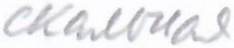скальная
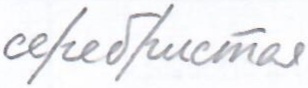серебристая
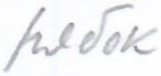рябок
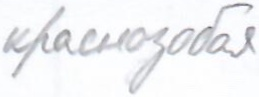краснозобая
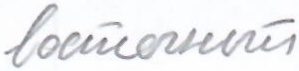восточный
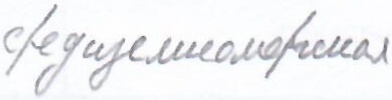средиземноморская
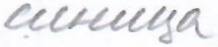синица
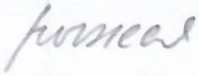рыжая
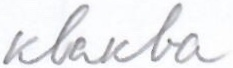кваква
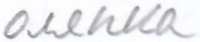оляпка
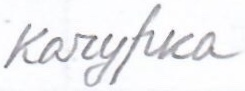качурка
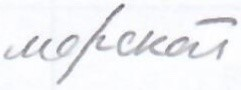морской
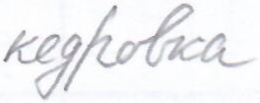кедровка
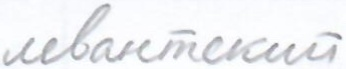левантский
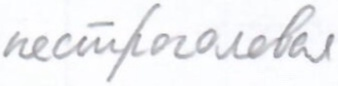пестроголовая
